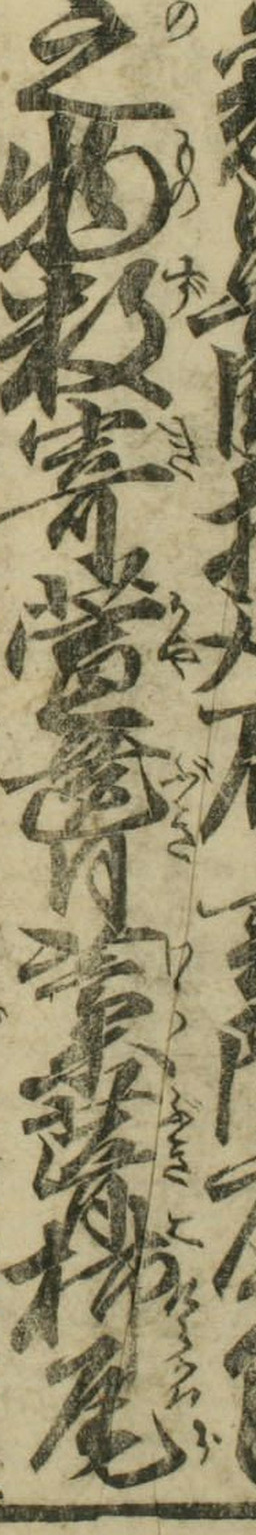之物数寄萱葺藁葺杮瓦
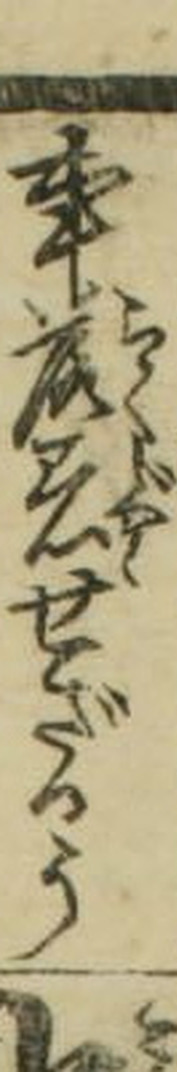事落着せざるう
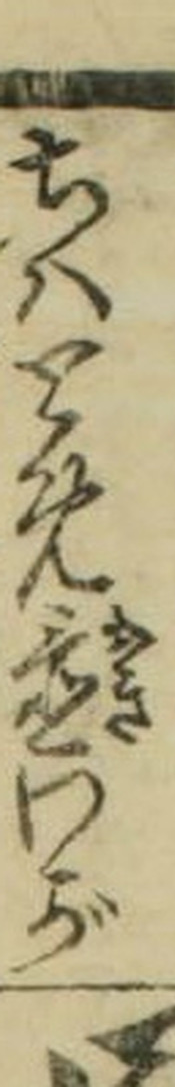ちはとめ置わが
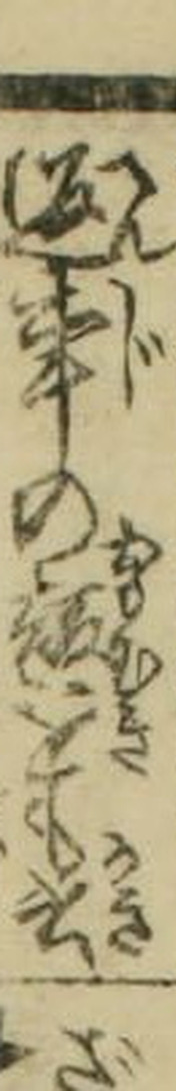返事の趣をも書
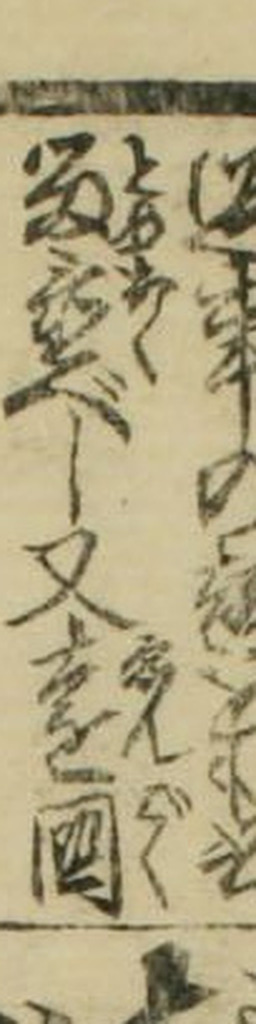留置べし又遠国
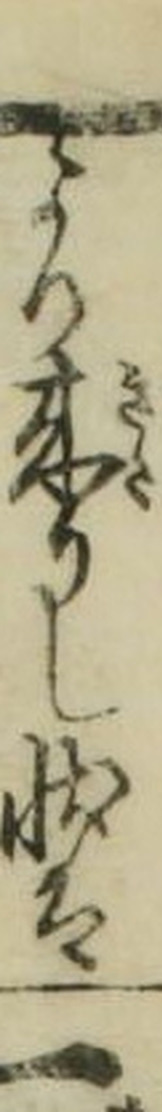より来りし状は
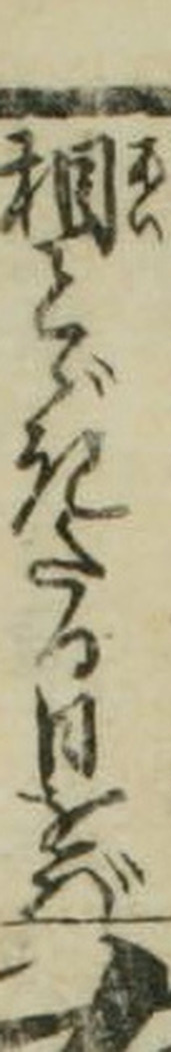相とゞきたる日をば
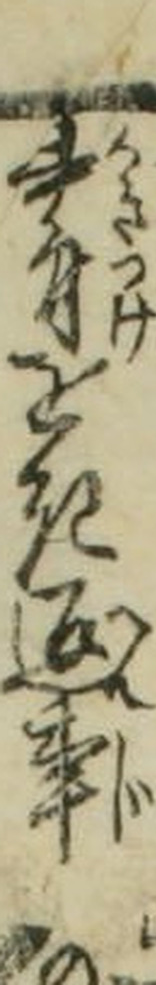書付をき返事
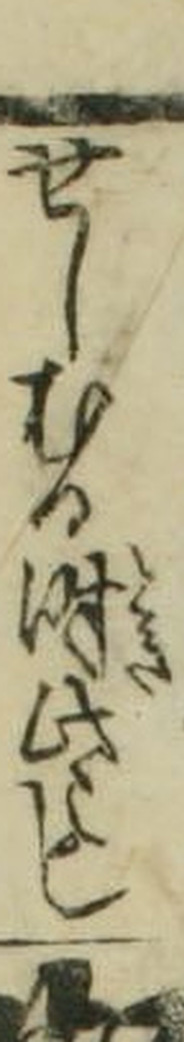せしむる時此よし
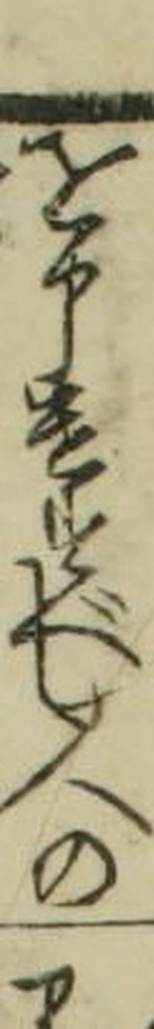を申遣すべし人の
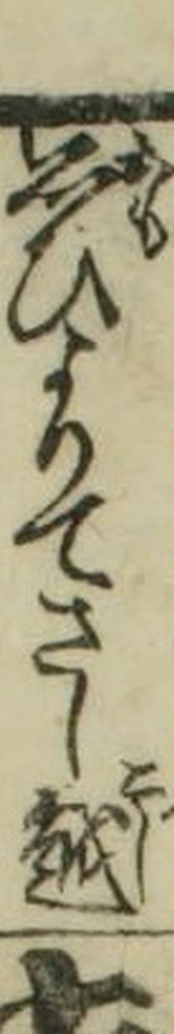思ひよりてさし越
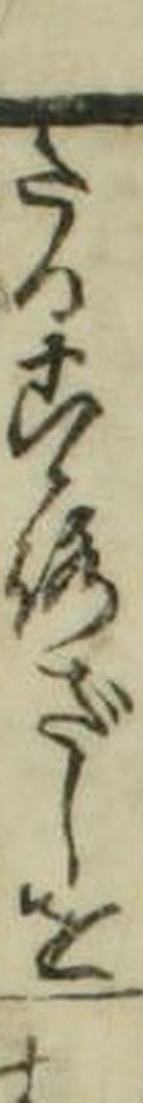たるこゝろざしを
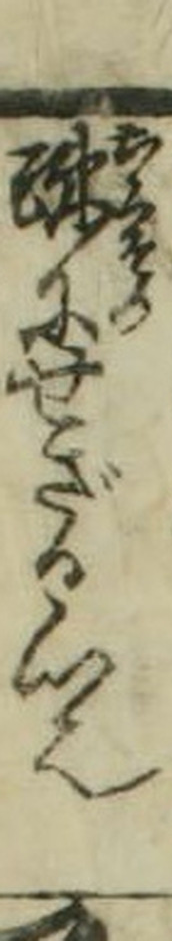疎にせざる心也
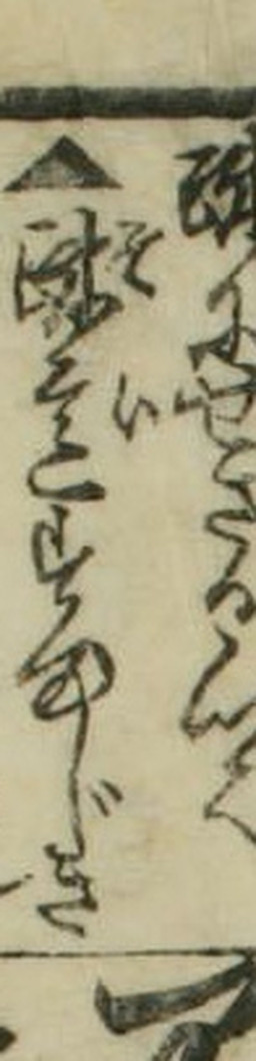▲疎意すまじき
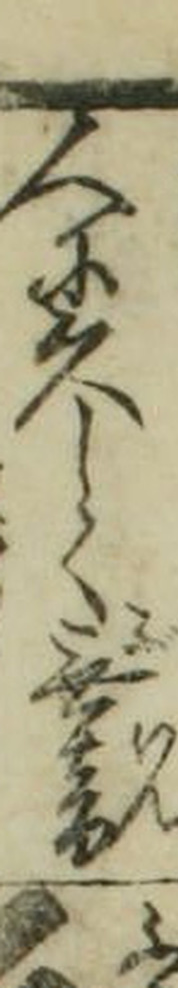人に久しく無音
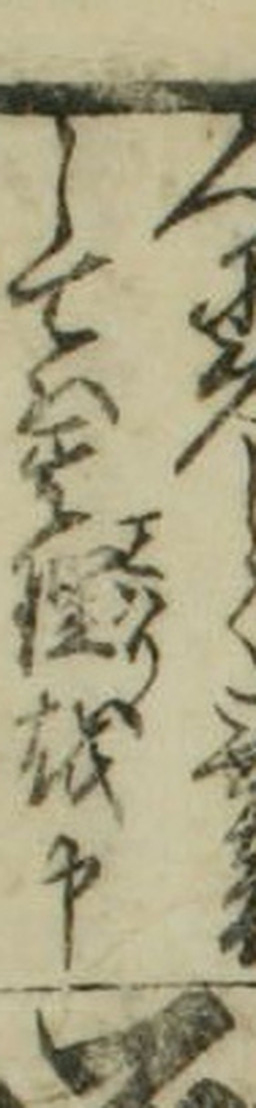しては其理を申
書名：増補職人往来
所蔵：東京学芸大学教育コンテンツアーカイブ
